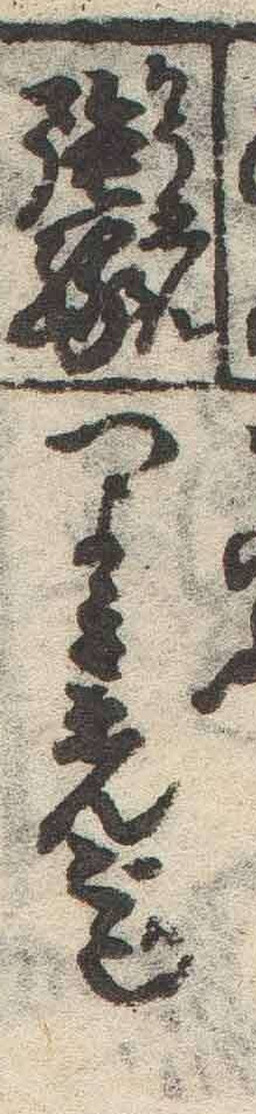強縁つよきゑんこ也
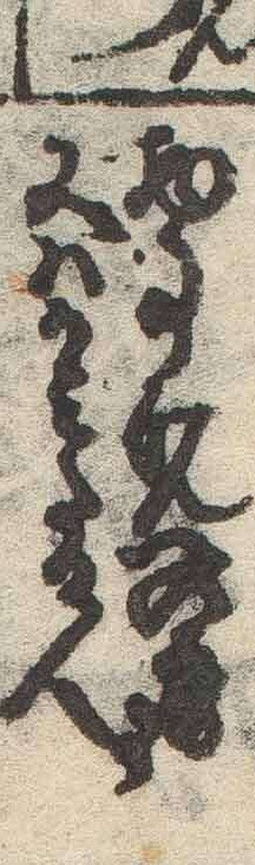又はかみたる人
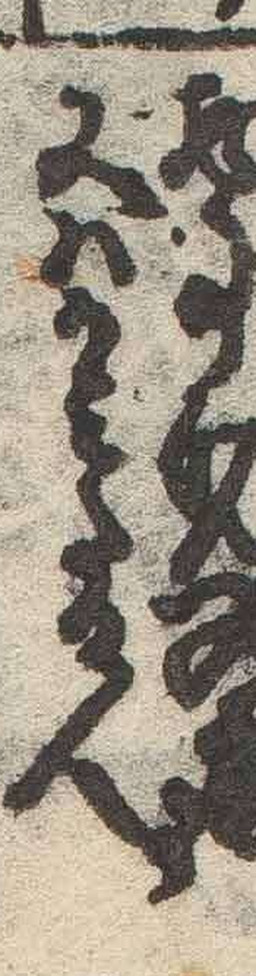又はかみたる人
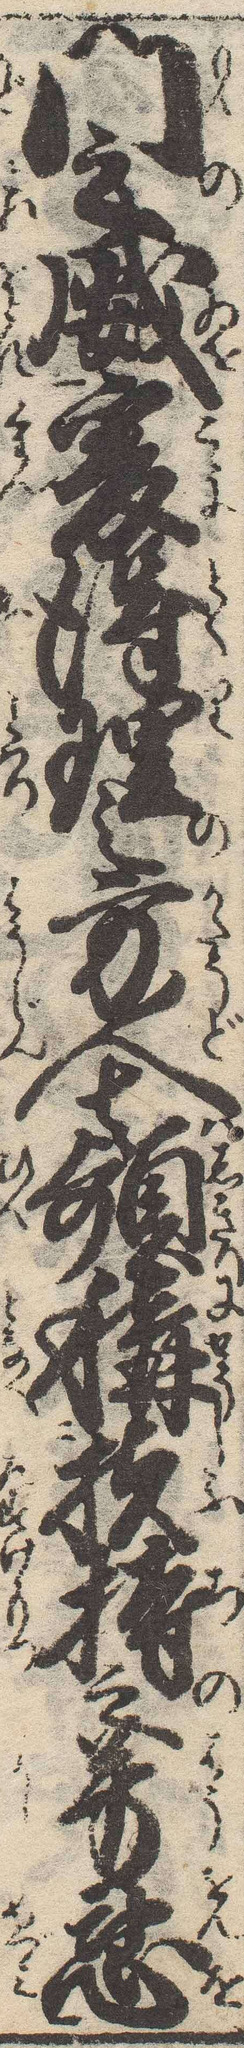門之威爰得理之方人者頻稱扶持之芳恩
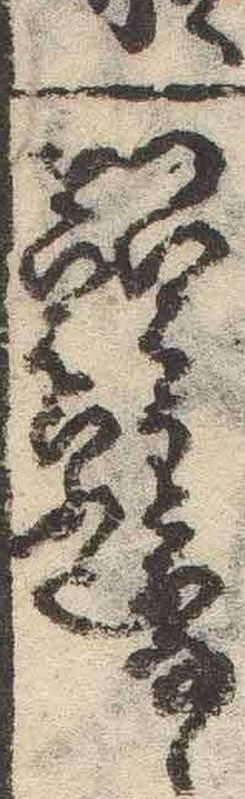をいはらふ也
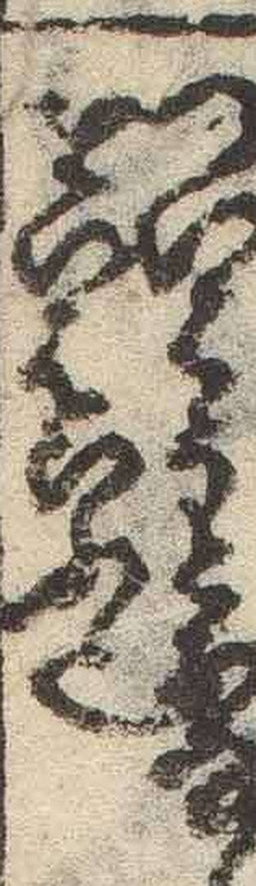をいはらふ也
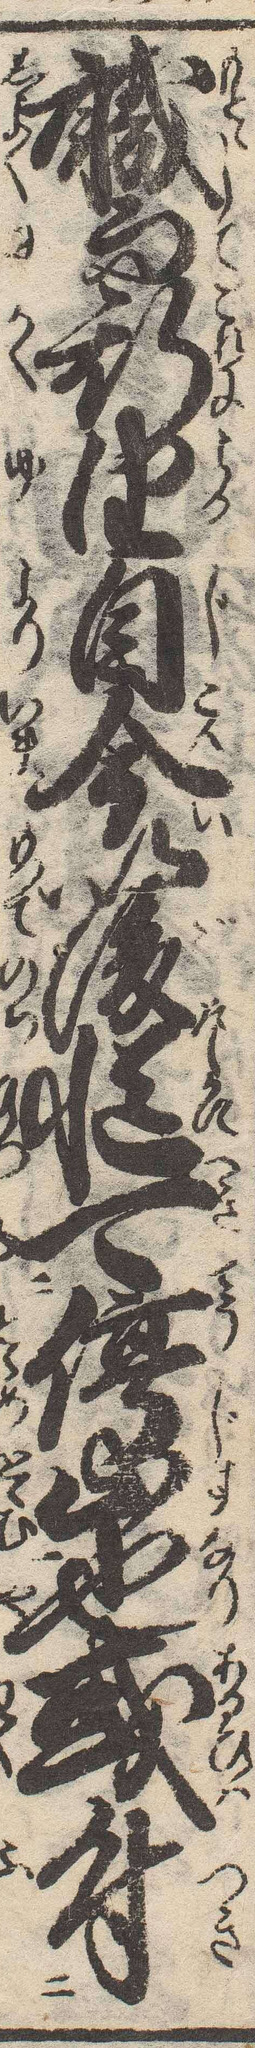職而斯由自今以後慥可停止也或付
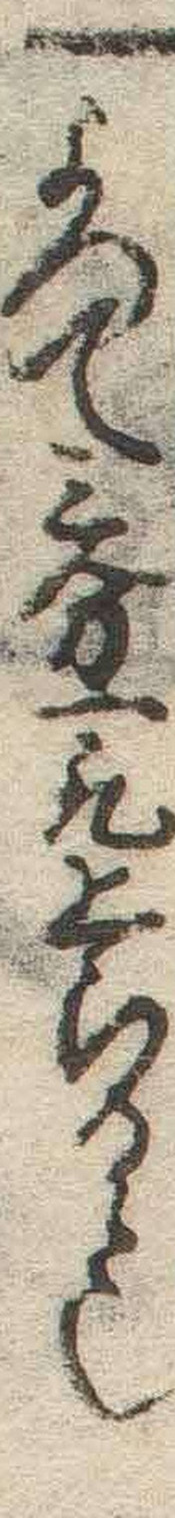よつて三分一取上らるゝなり
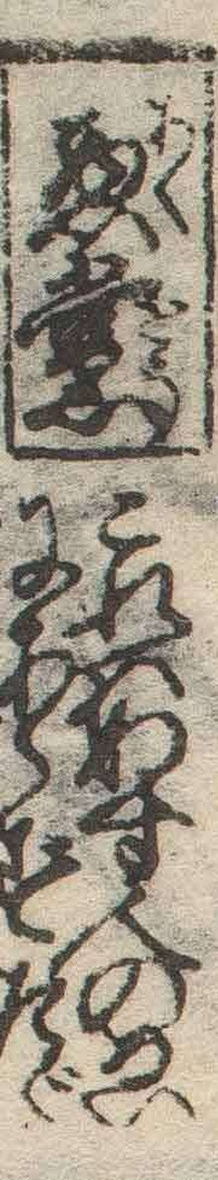悪黨これはぬす人のるい
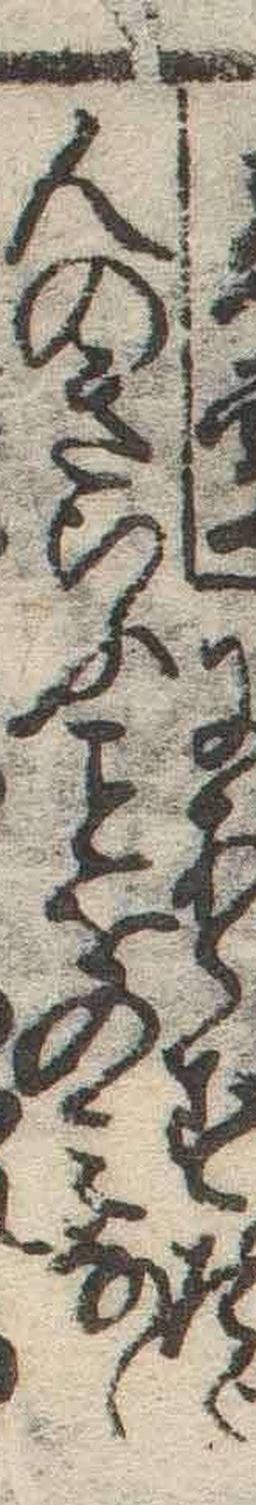人のきらふことをのみなし
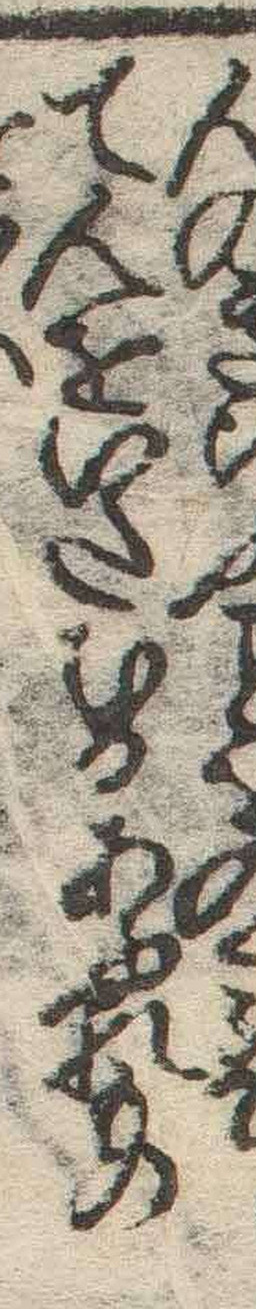て人をいたむるあふれもの
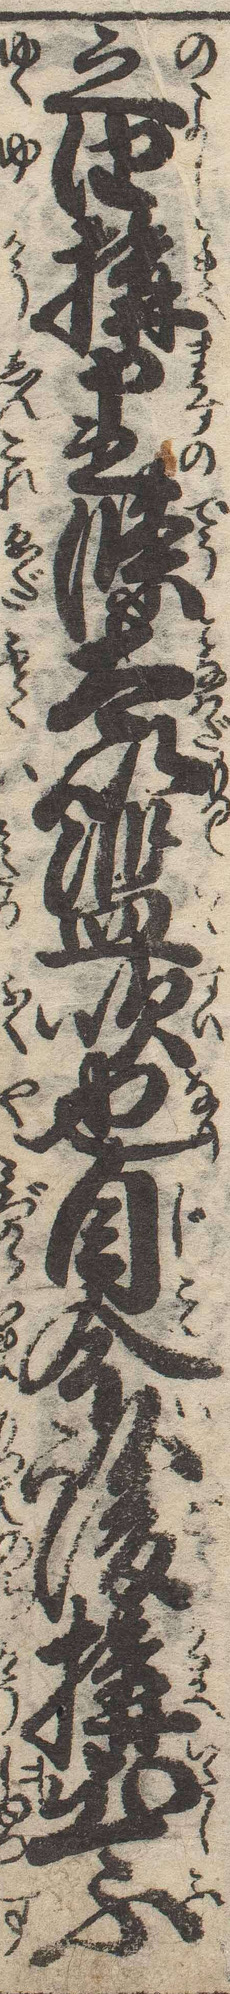之由構申之條太以濫吹也自今以後構-出不
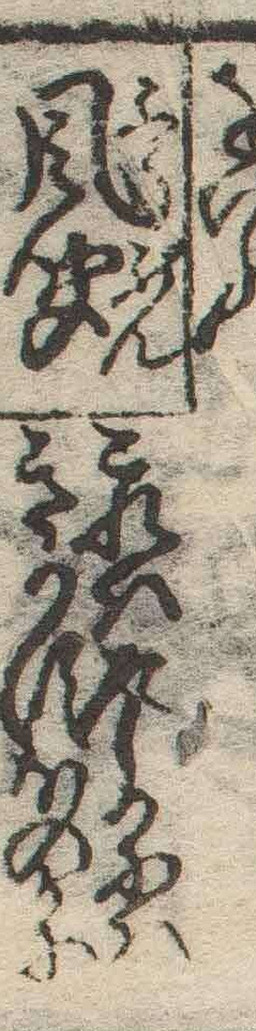風聞これはたしかには
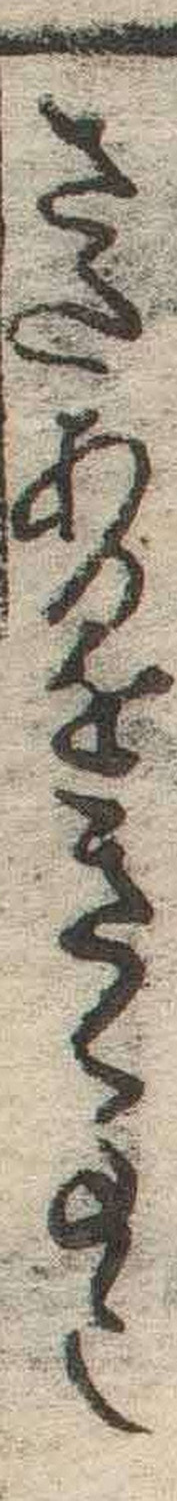ささあるをきく事也
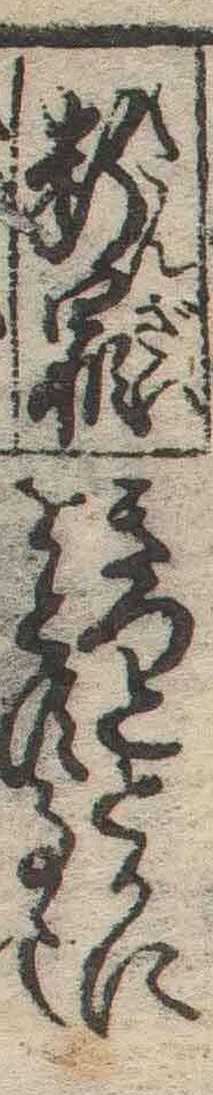断罪きつととかに
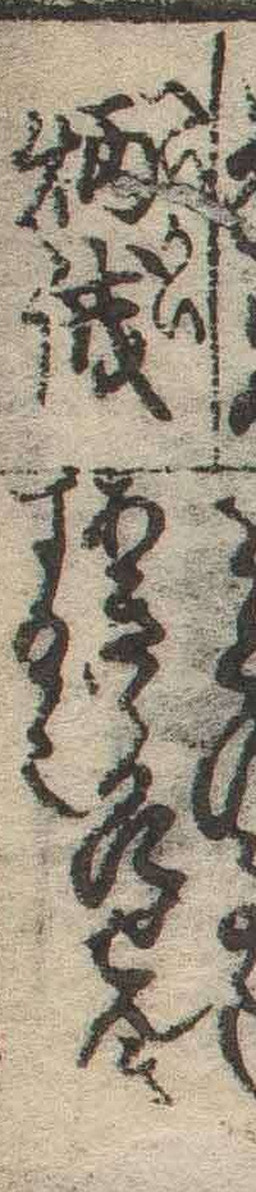炳誡あきらかにせんき
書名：御成敗式目絵抄
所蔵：東京学芸大学附属図書館 国文学研究資料館
